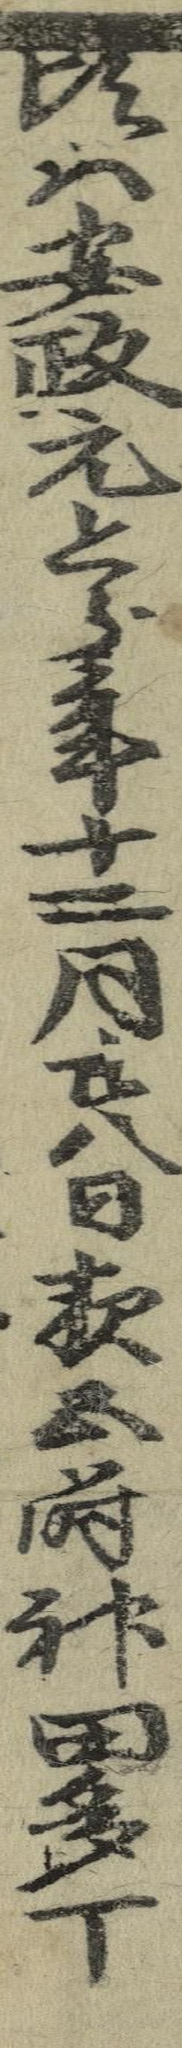頃は安政元とら年十二月廿八日夜五前神田多丁
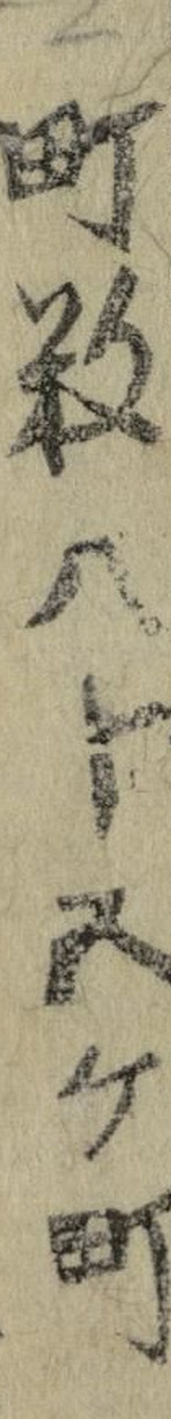町数八十五ヶ町
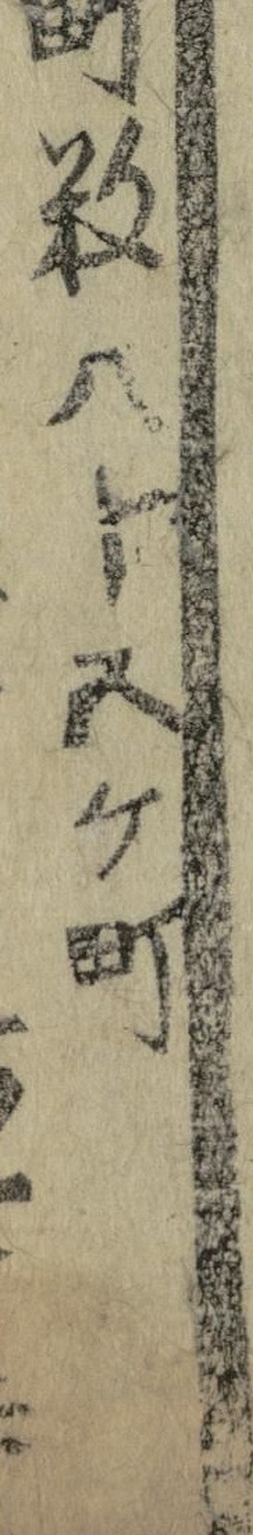町数八十五ヶ町
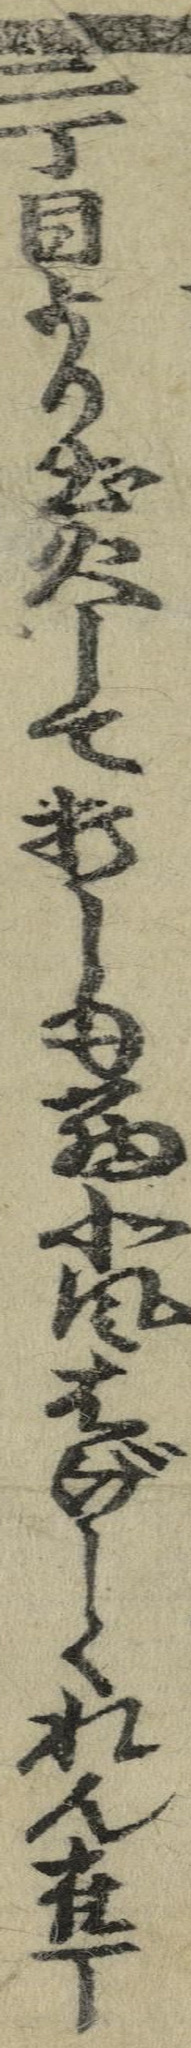二丁目より出火して折しも西北風はげしくれん雀丁
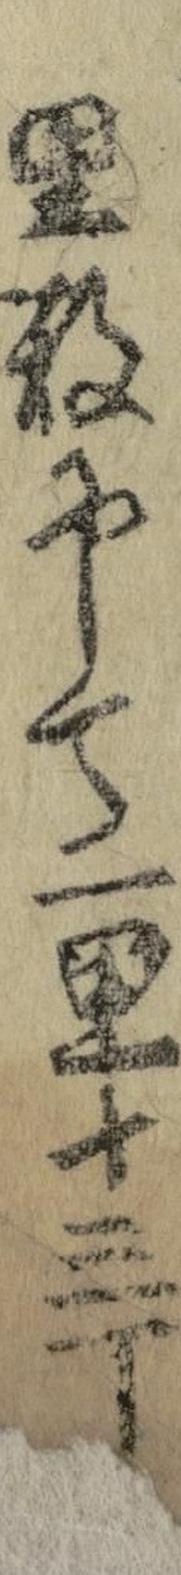里数にして一里十三丁
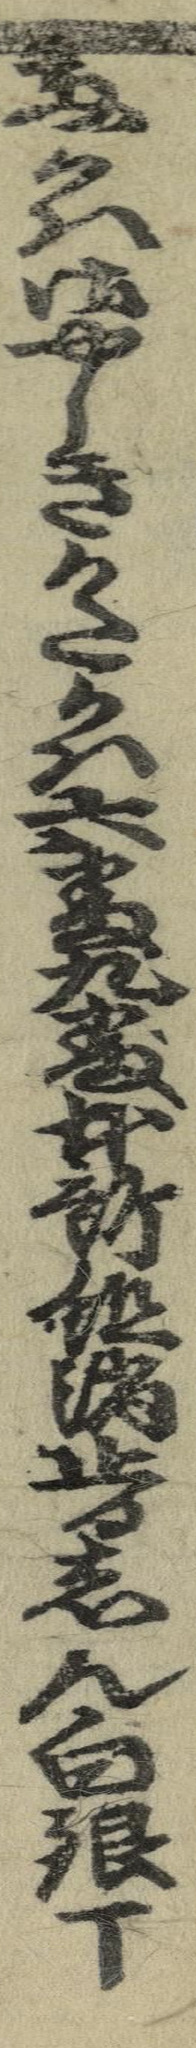兩かは御やしきかたかは六番九番本所組消止るしん白銀丁
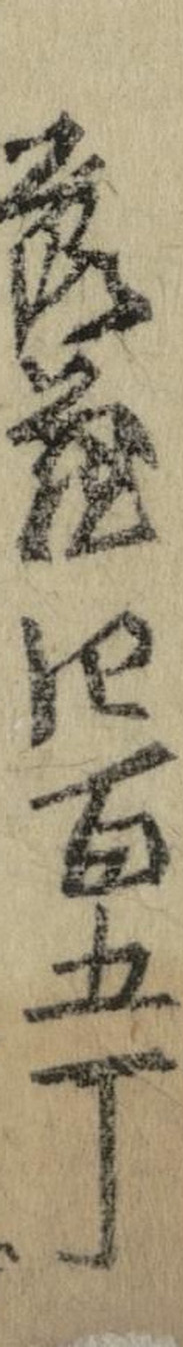落蔵四百五丁
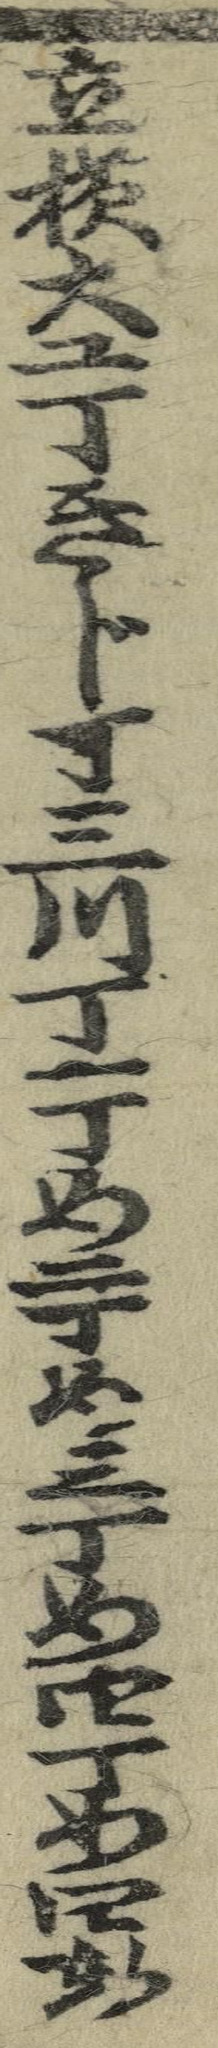立横大工丁きじ丁三川丁一丁め二丁め三丁め四丁め四軒
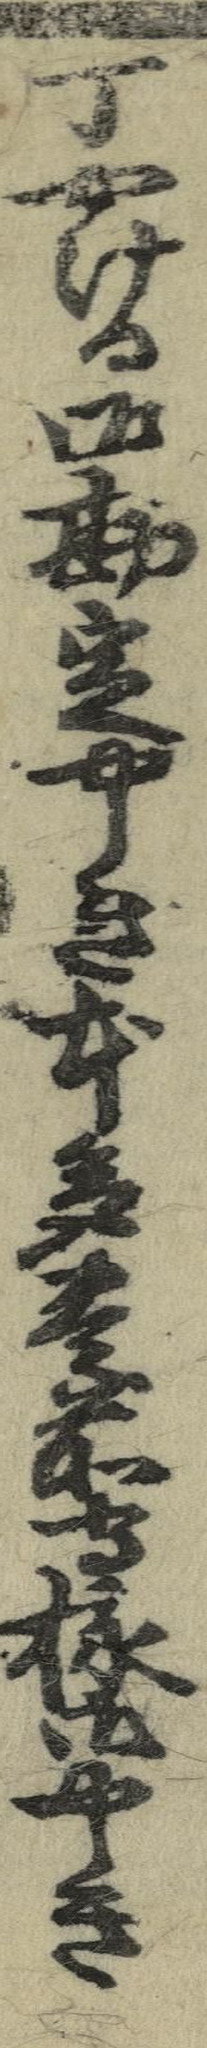丁やける御勘定やしき本多豊前守様御やしき
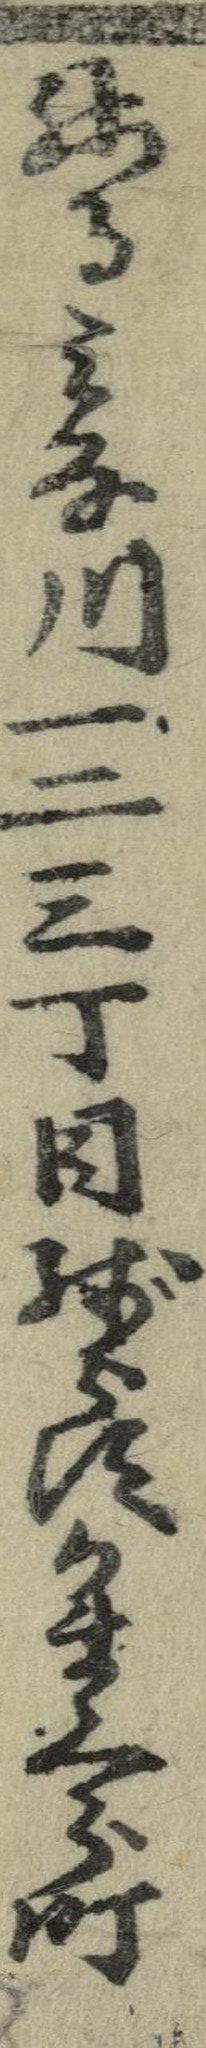残るみな川一二三丁目残らずかまくら町
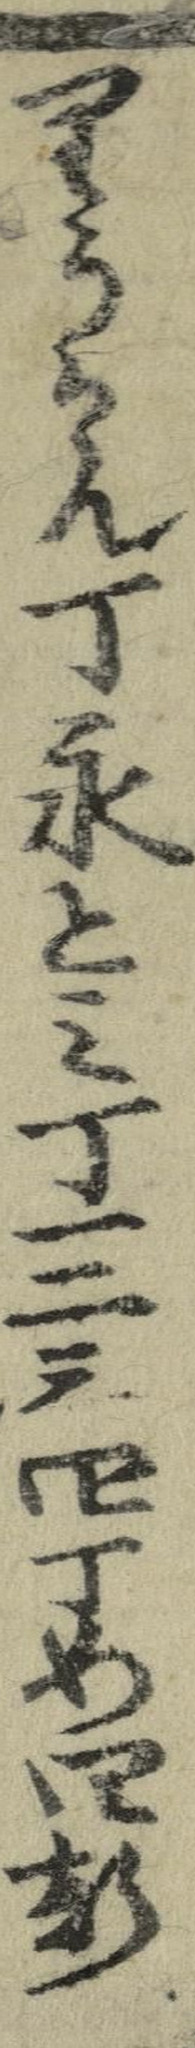りうかん丁永とも丁一二三四丁め四軒
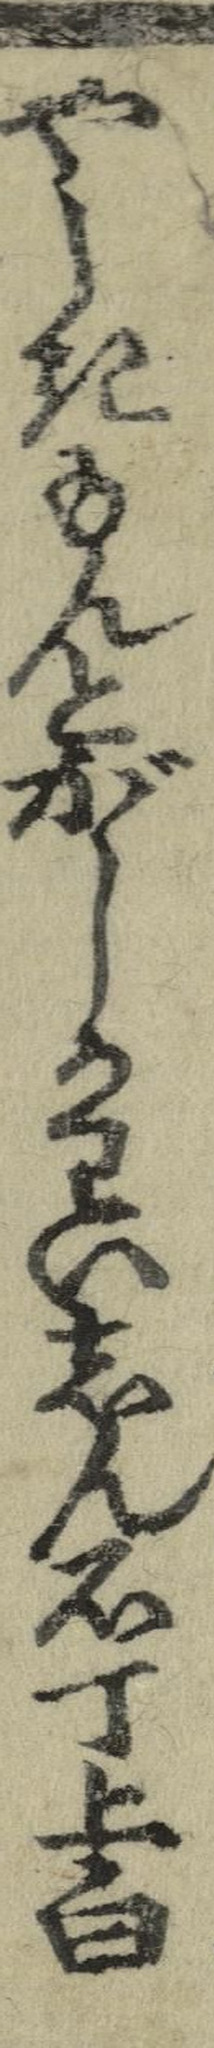やしきもんどがしかわいしん石丁上白
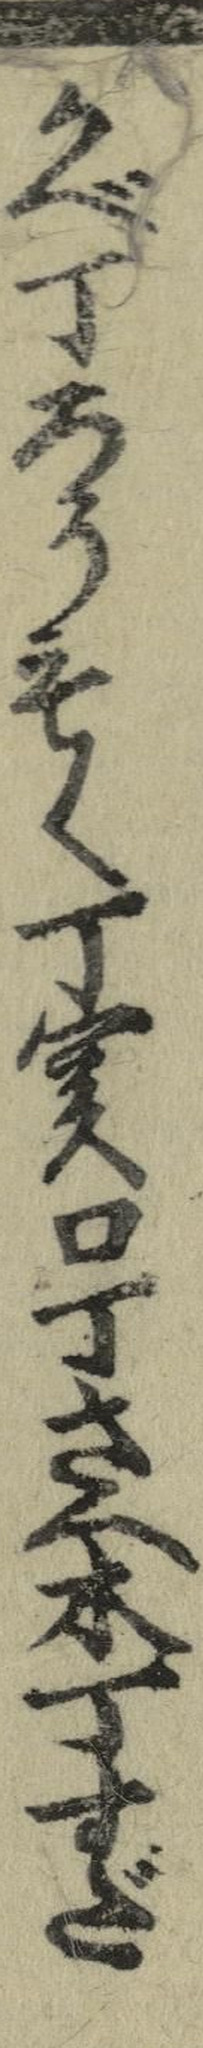かべ丁ろうそく丁関口丁さへ木丁すだ
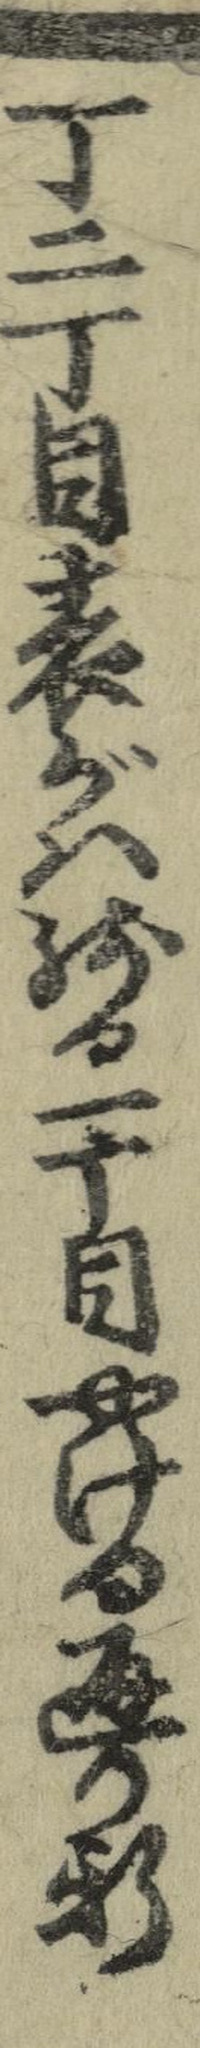丁二丁目表がは残る一丁目やける通り新
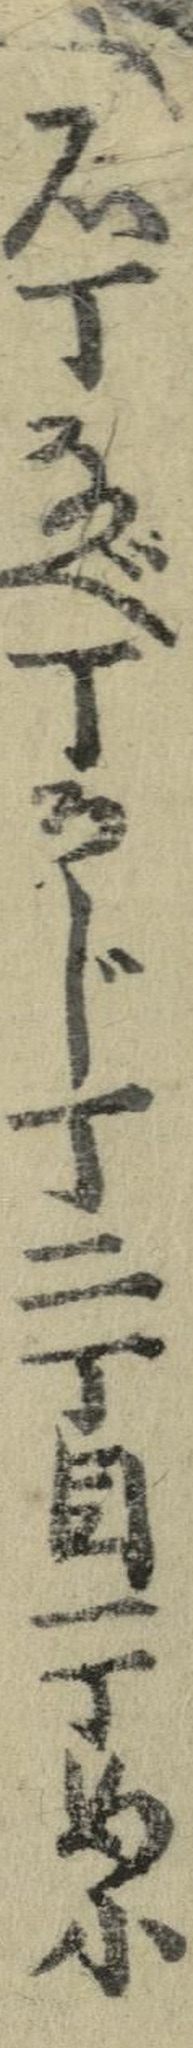石丁なべ丁かじ丁二丁目一丁め小
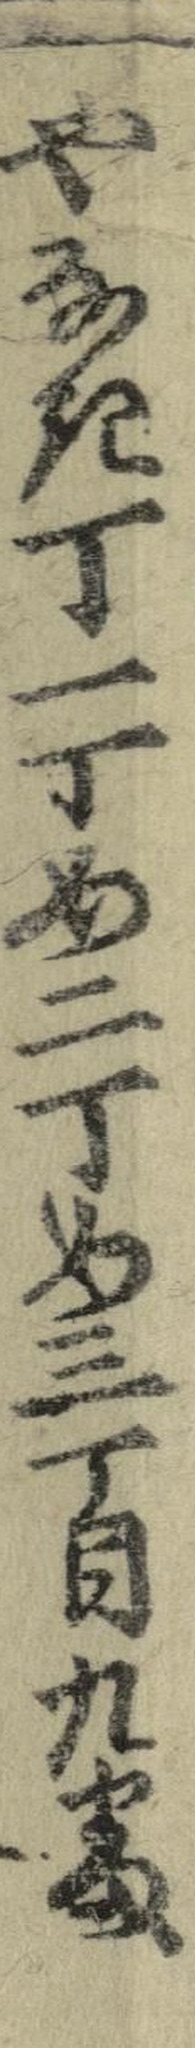やなぎ丁一丁め二丁め三丁目九番
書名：[安政元年十二月の江戸大火に関する瓦版]
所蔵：東京大学地震研究所図書室 Earthquake Research Institute Library, The University of Tokyo, JAPAN
